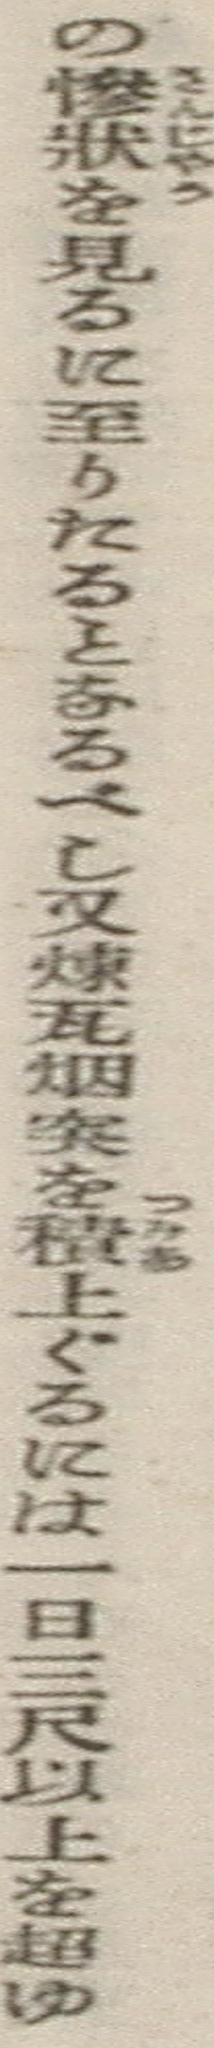の惨状を見るに至りたることなるべし又煉瓦烟突を積上ぐるには一日三尺以上を超ゆ
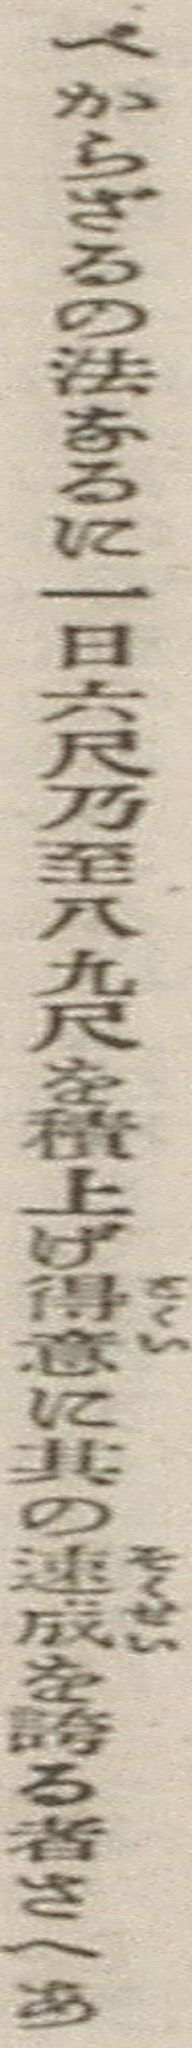べからざるの法なるに一日六尺乃至八九尺を積上げ得意に其の速成を誇る者さへあ
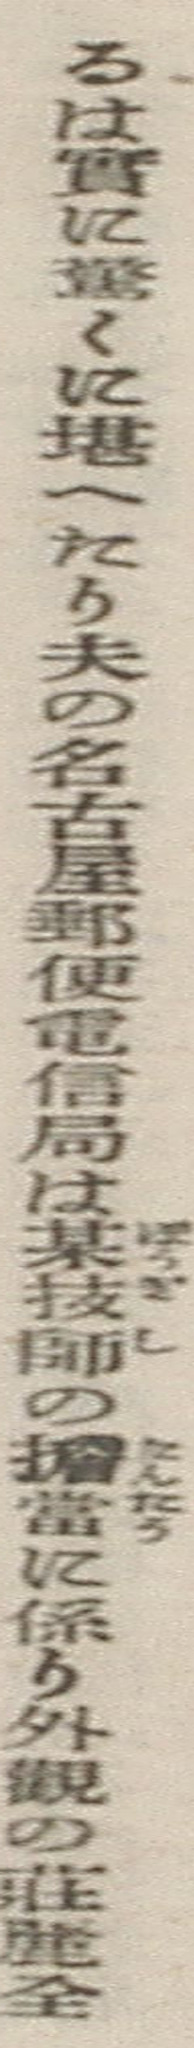るは実に驚くに堪へたり夫の名古屋郵便電信局は某技師の担当に係り外観の壮麗全
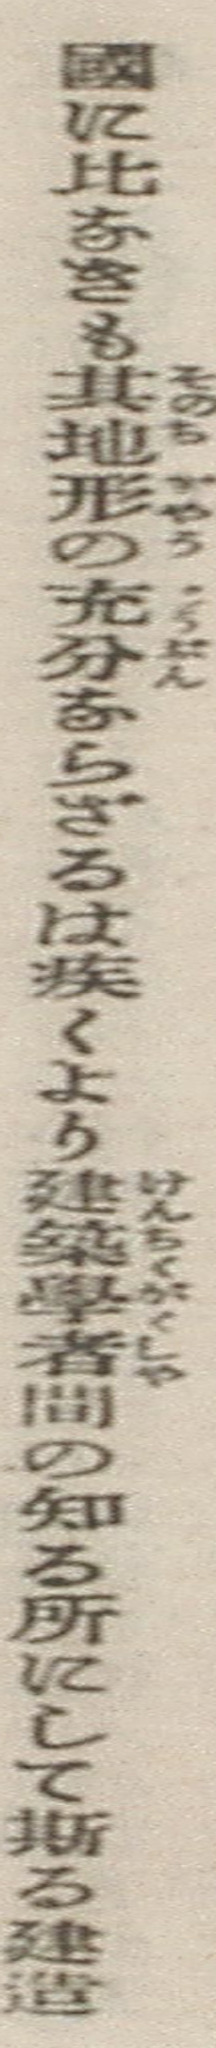国に比なきも其地形の充分ならざるは疾くより建築学者間の知る所にして斯る建造
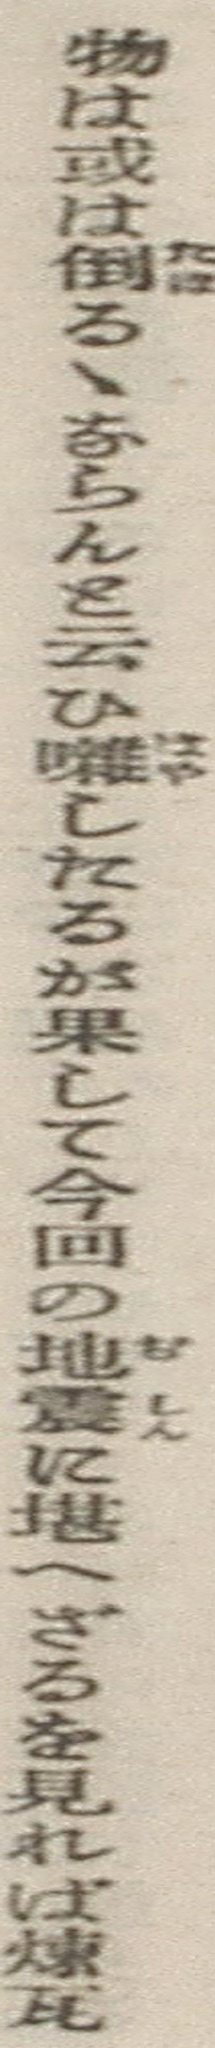物は或は倒るゝならんと云ひ囃したるが果して今回の地震に堪へざるを見れば煉瓦
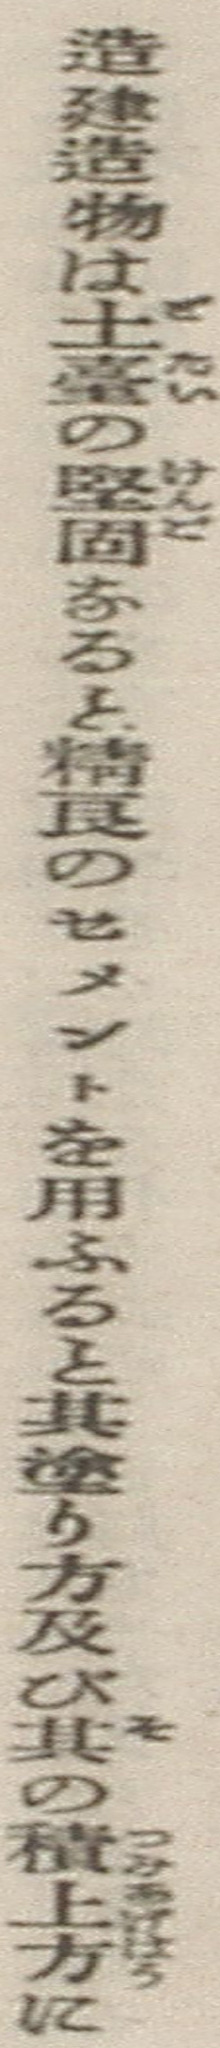造建造物は土台の堅固なると精良のセメントを用ふること其塗り方及び其の積上方に
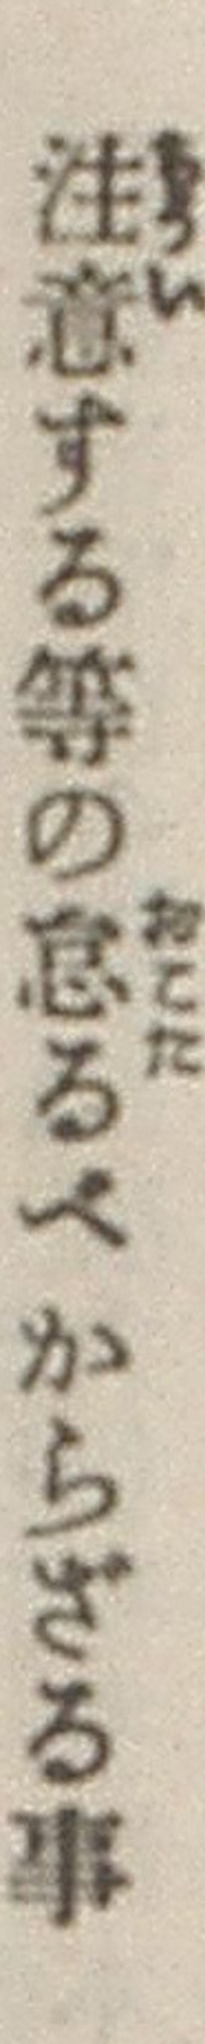注意する等の怠るべからざる事
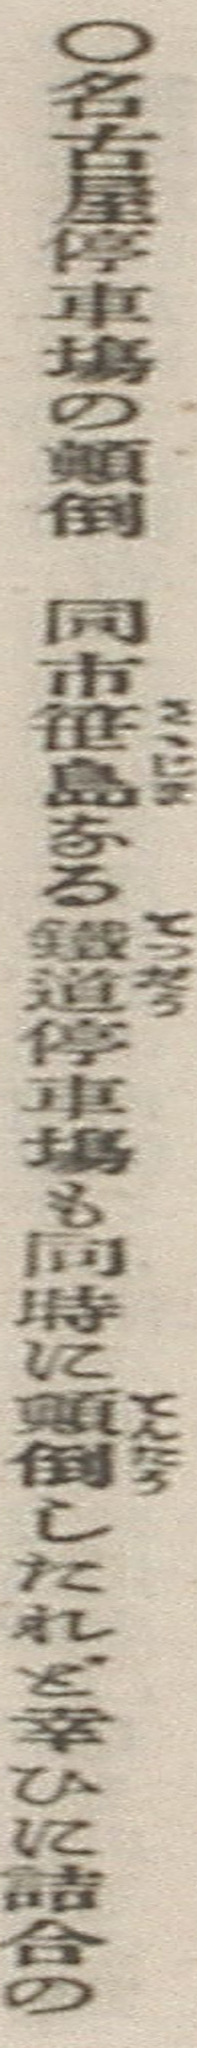○名古屋停車場の顛倒同市笹島なる鉄道停車場も同時に顛倒したれど幸ひに詰合の
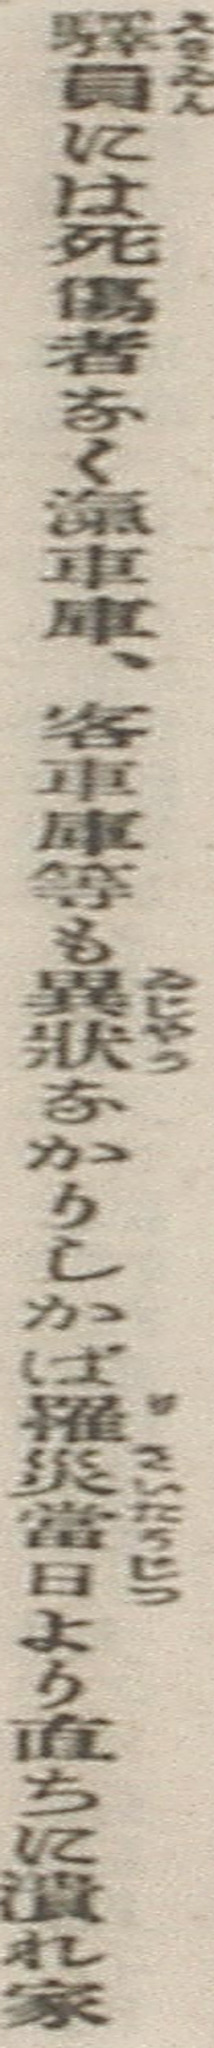駅員には死傷者なく汽車庫、客車庫等も異状なかりしかば罹災当日より直ちに潰れ家
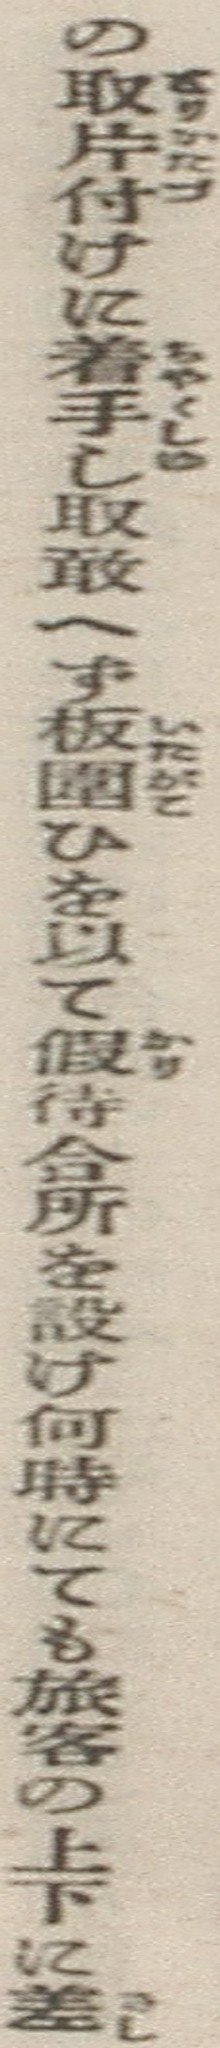の取片付けに着手し取敢へず板囲ひを以て仮待合所を設け何時にても旅客の上下に差
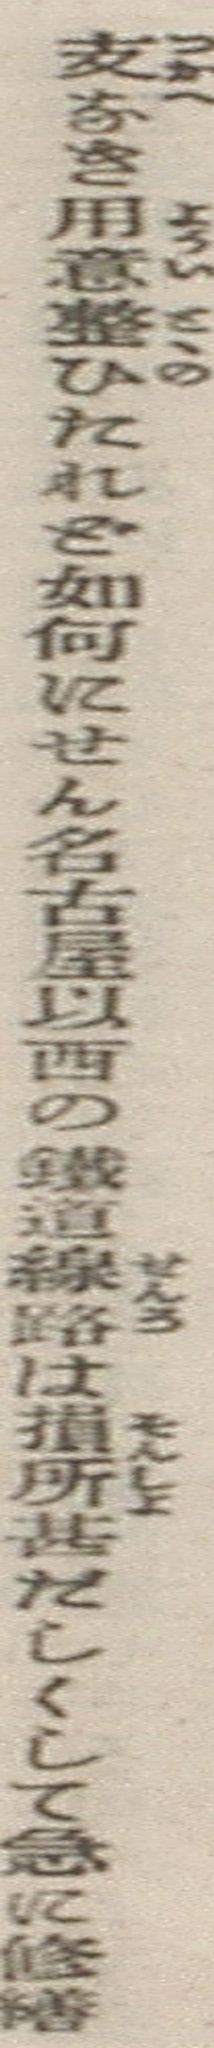支なき用意整ひたれど如何にせん名古屋以西の鉄道線路は損所甚だしくして急に修繕
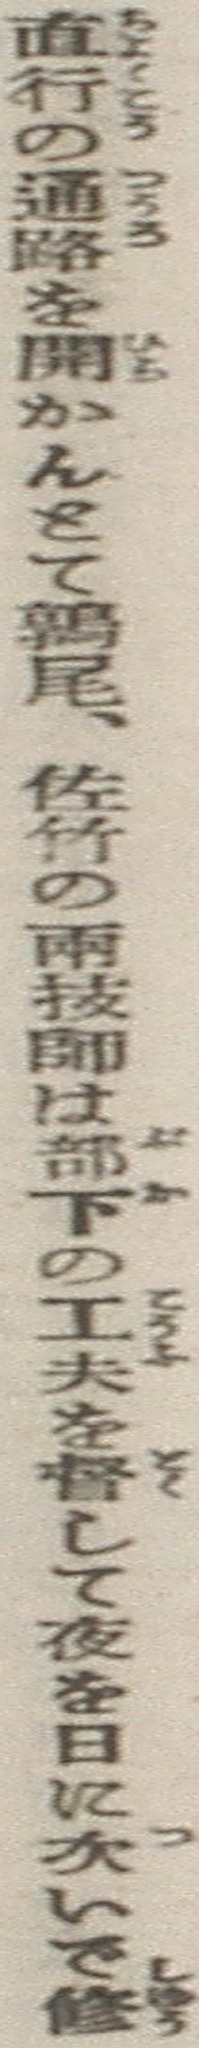直行の通路を開かんとて鶉尾、佐竹の両技師は部下の工夫を督して夜を日に次いで修
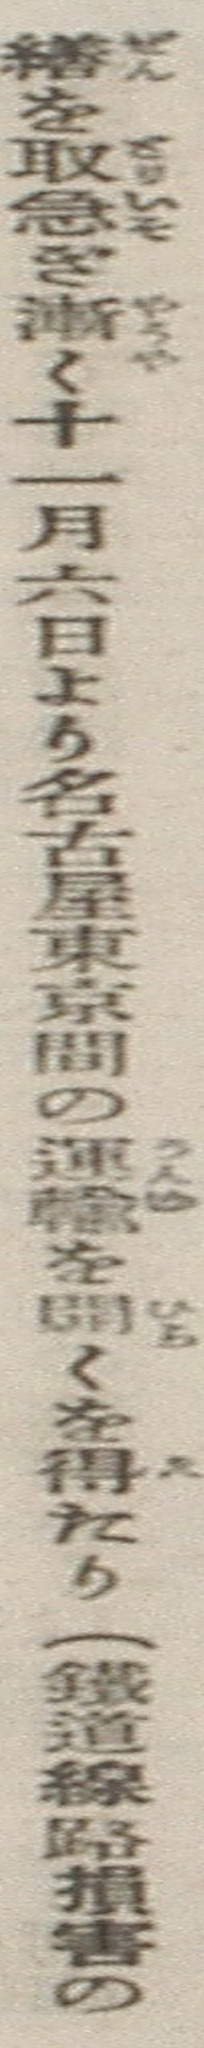繕を取急ぎ漸く十一月六日より名古屋東京間の運輸を開くを得たり（鉄道線路損害の
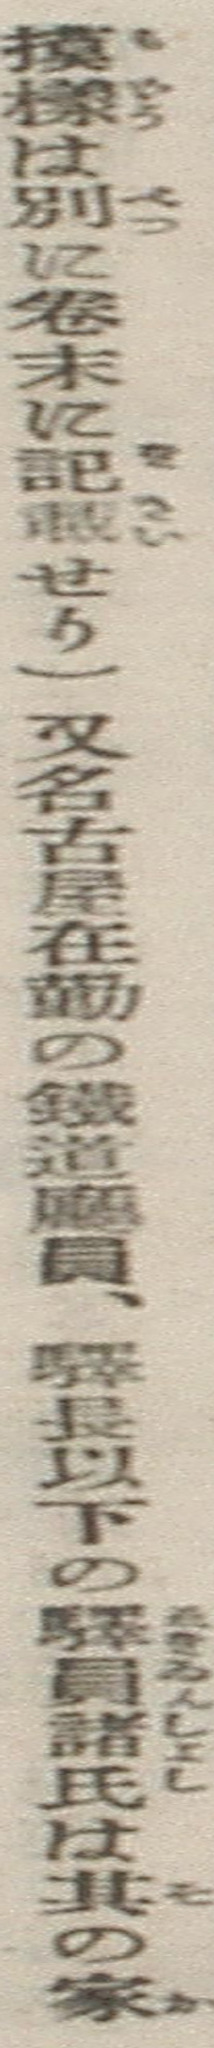模様は別に巻末に記載せり）又名古屋在勤の鉄道庁員、駅長以下の駅員諸氏は其の家
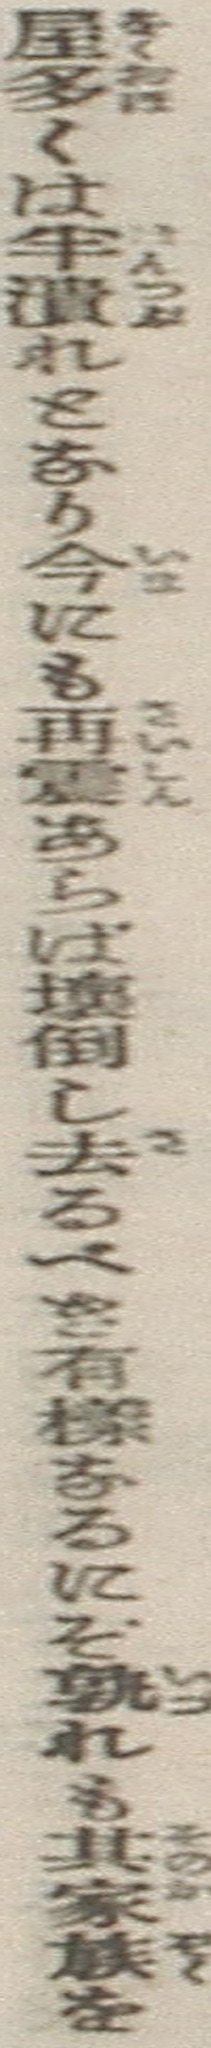屋多くは半潰れとなり今にも再震あらば壊倒し去るべき有様なるにぞ孰れも其家族を
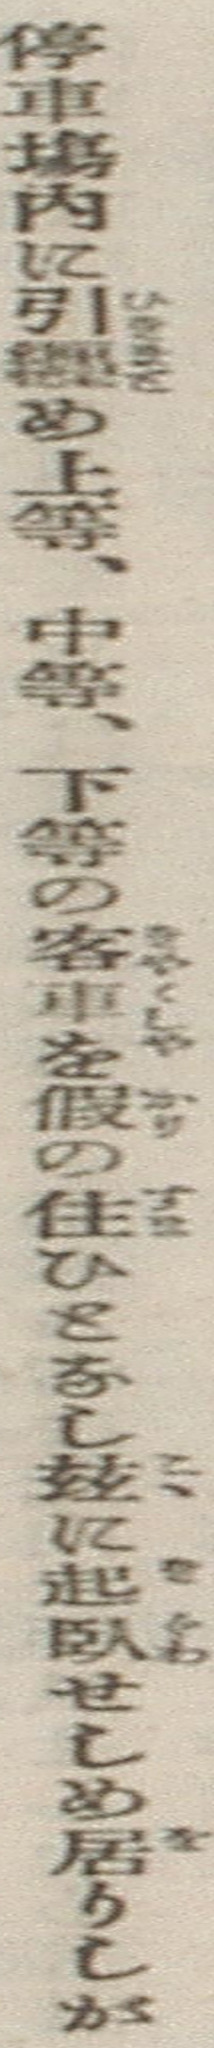停車場内に引纏め上等、中等、下等の客車を仮の住ひとなし茲に起臥せしめ居りしが
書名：愛知岐阜福井三県　大地震見聞録（内題）
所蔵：東京大学地震研究所図書室 Earthquake Research Institute Library, The University of Tokyo, JAPAN
